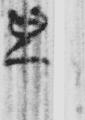也
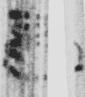是
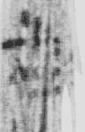古（故）
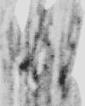亓（其）
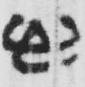心
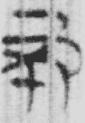不
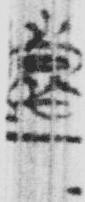遠
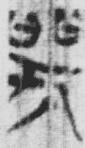哭
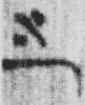之
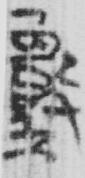○（動）
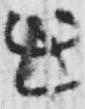心
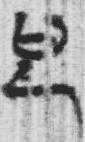也
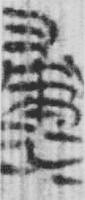浸
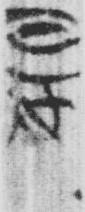焊
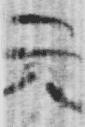亓
